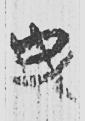𡚦
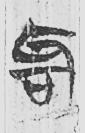{㠯ㅋ}
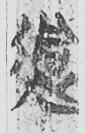迵
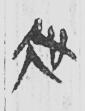吳
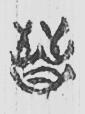晉
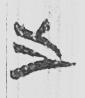之
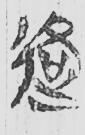{辶各}
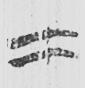二
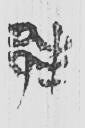邦
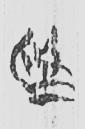爲
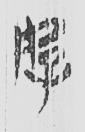好
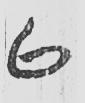㠯（以）
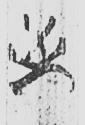至
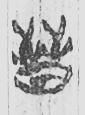晉
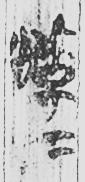悼=
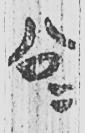公=
